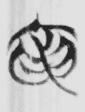龜
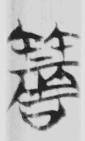{竹巫口}
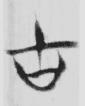古
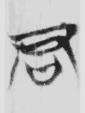君
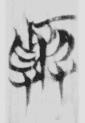與
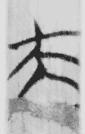夫=
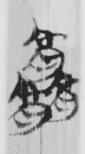{兔兔兔}
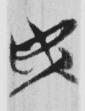𡚦
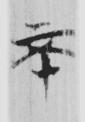不
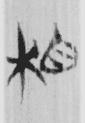相
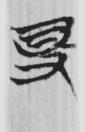𠭁
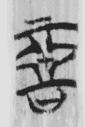{亞口}
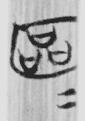區=
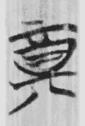奠
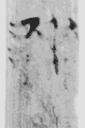邦
